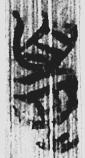辠（罪）
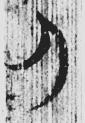人
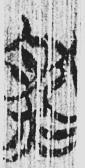然
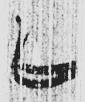㠯（以）
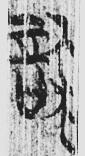○（讒）
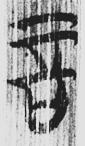言
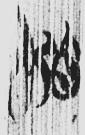相
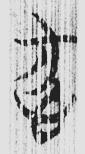○（謗）
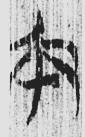尔（爾）
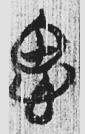思（使）
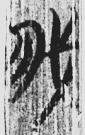我
